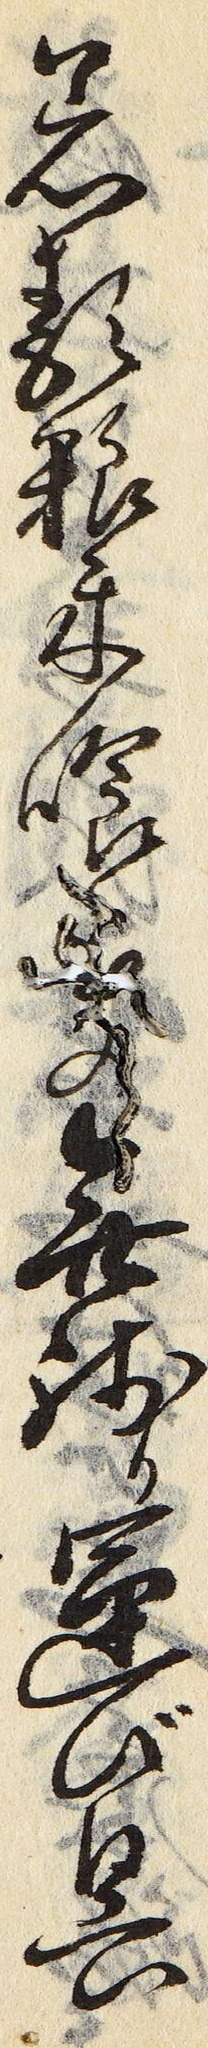着類粮米喰もの無残り運び呉
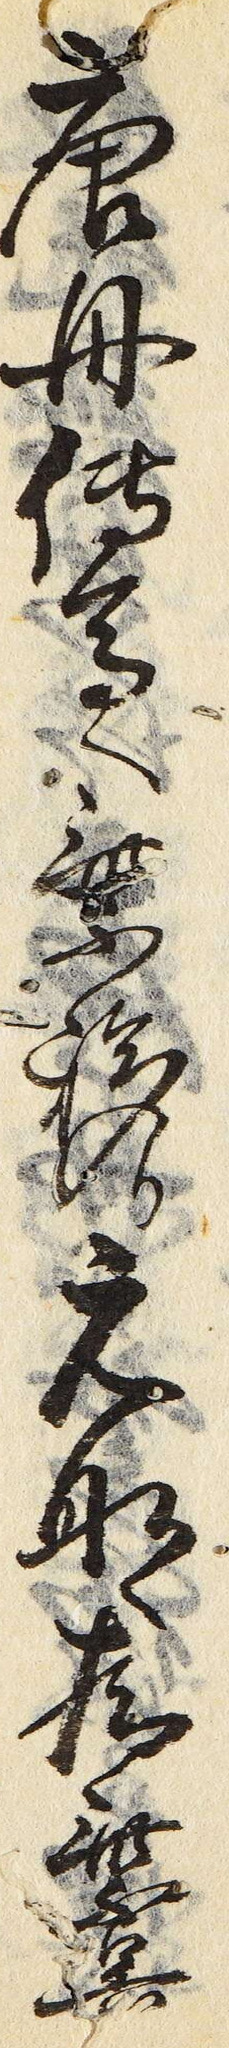唐舟伝馬へ乗移り元船へ為乗呉
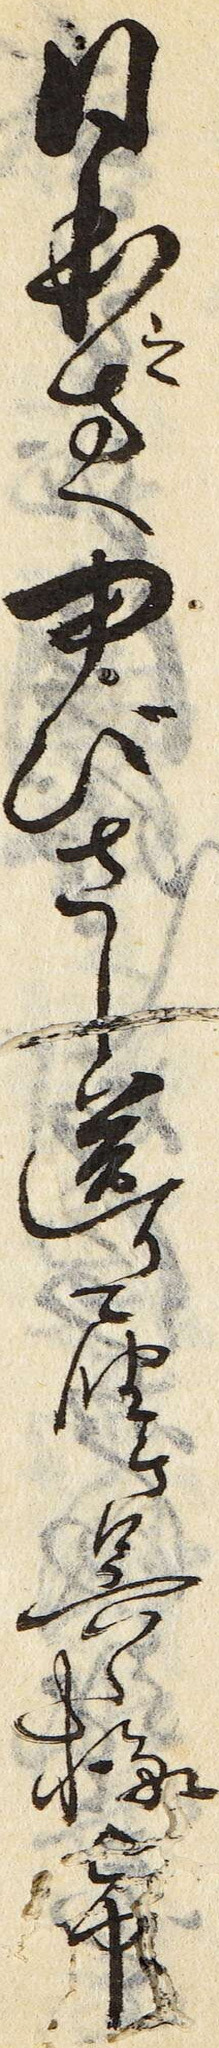日本之方へゆびさし送り届ケ呉候様被申
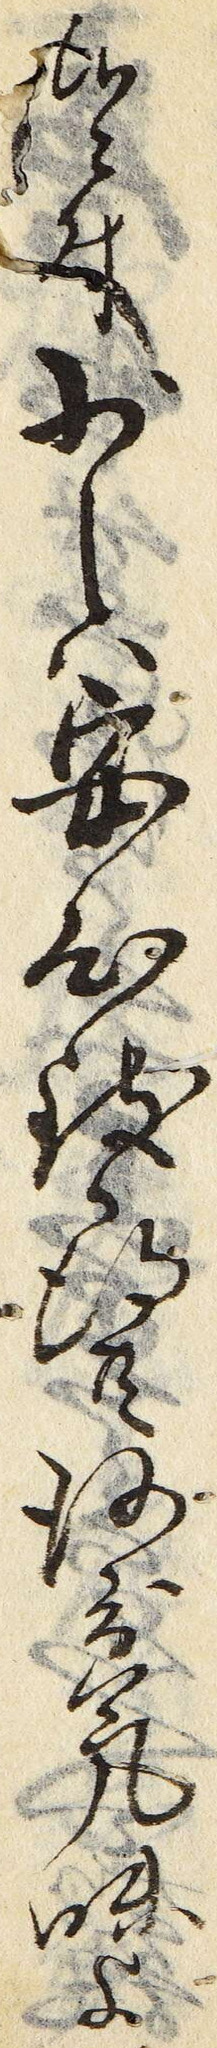候ニ付少しハ安心致候得共何分味よ
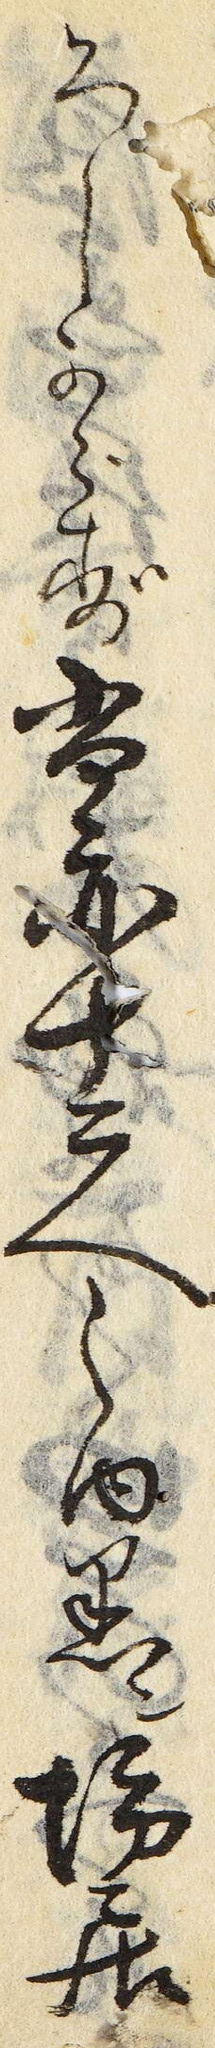ろしからず尚亦十二人之内黒ン坊居
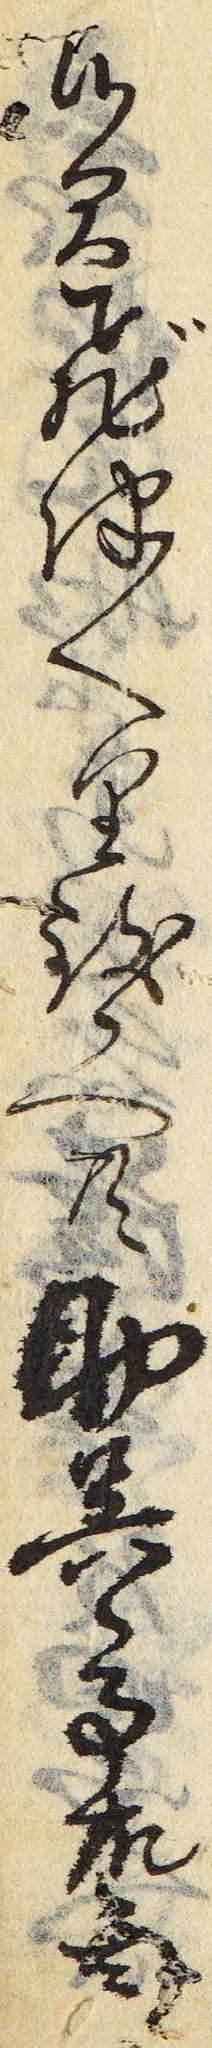候間びつくり致候へ共助呉候事故其

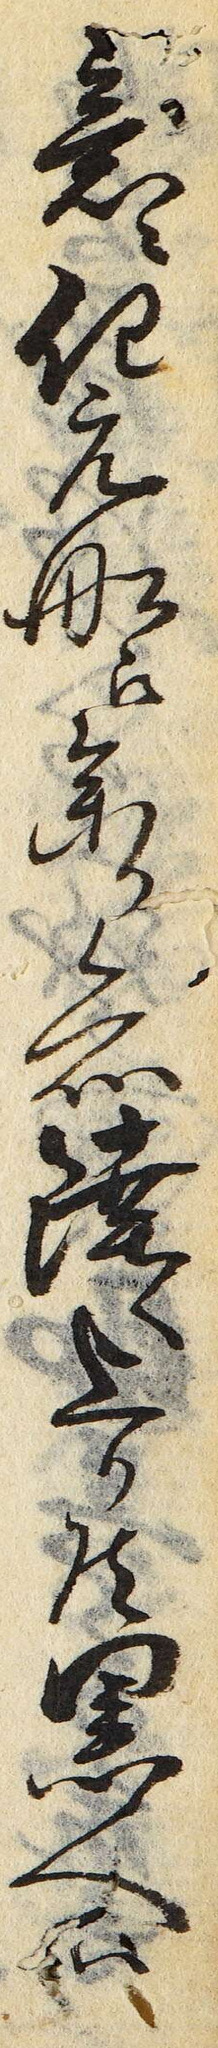意ニ任元船え参り候所陸へ上り候黒人ハ
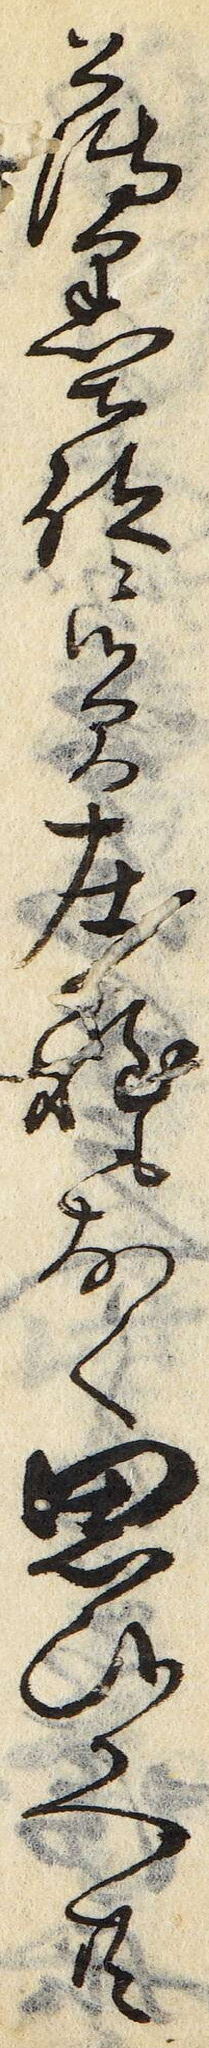薄墨位ニ候間左程もなく思ひ候へ共
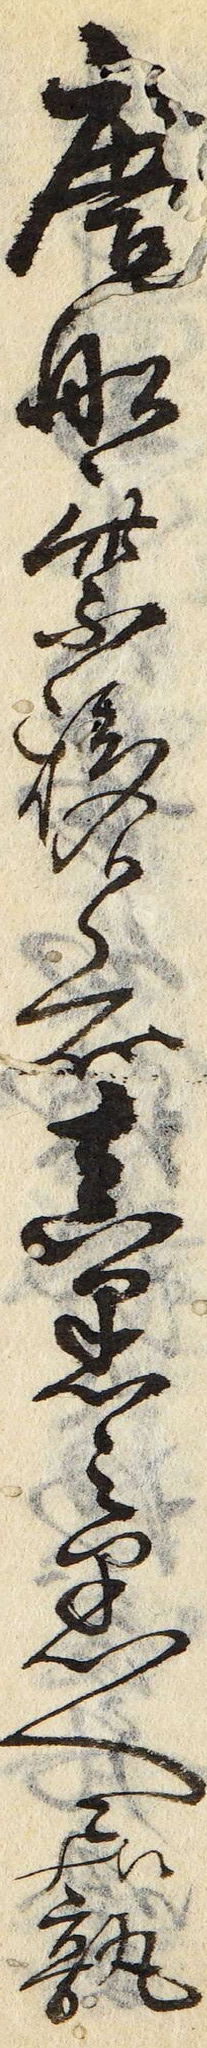唐船乗移り候所真黒之黒人居孰
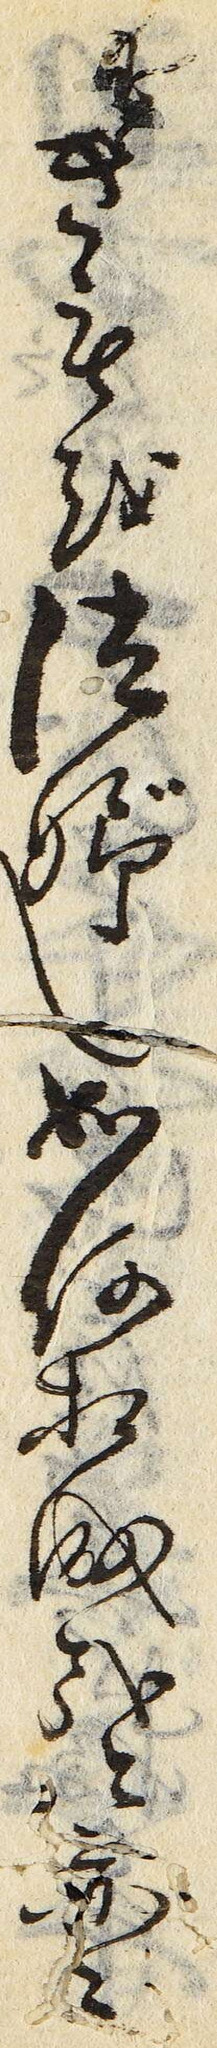もきもをつぶし如何相成哉と亦々
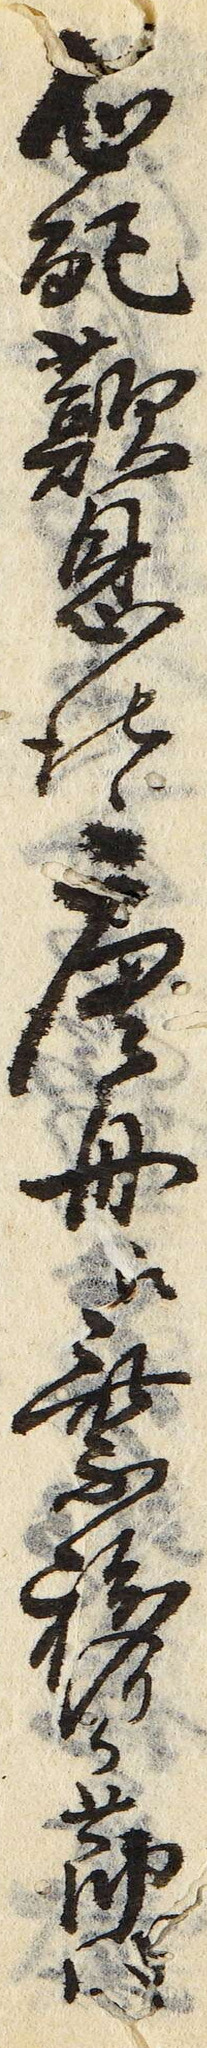心配歎息仕候唐舟え乗移り候節ハ
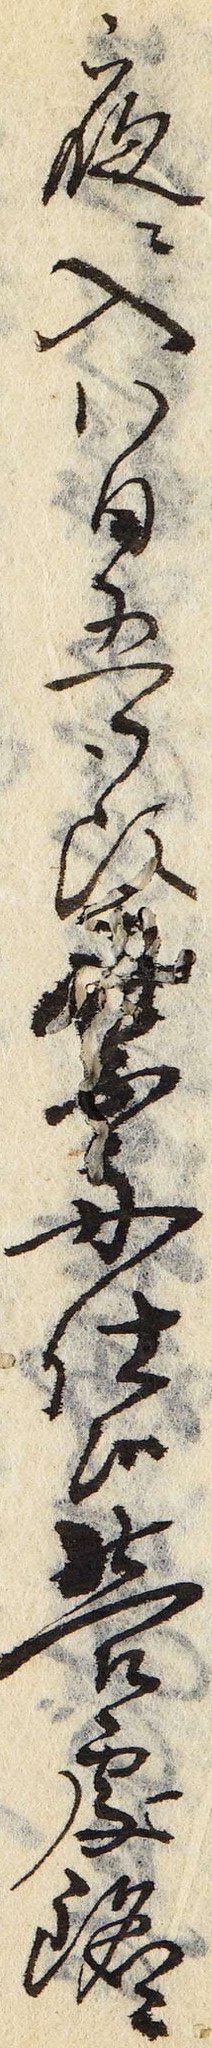夜ニ入八日五ツ頃乗舟仕候然ル処銘々
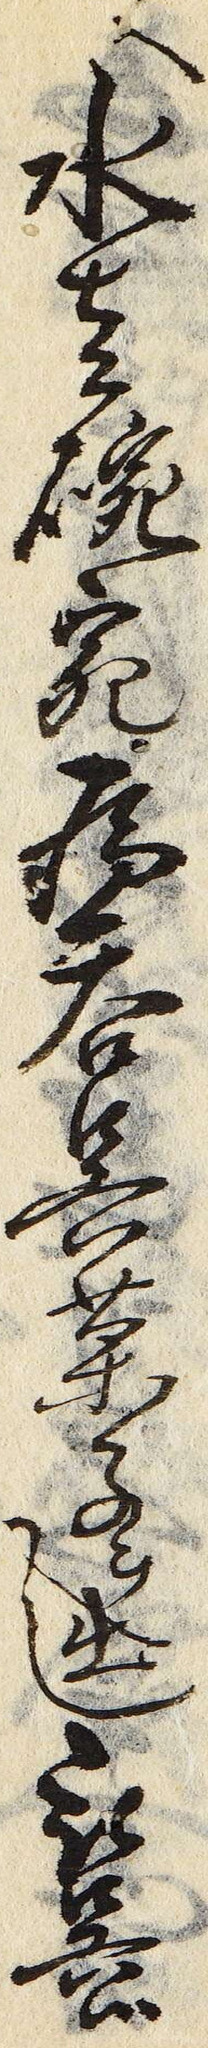へ水壱碗宛為呑呉菓子ヲ出し被呉候
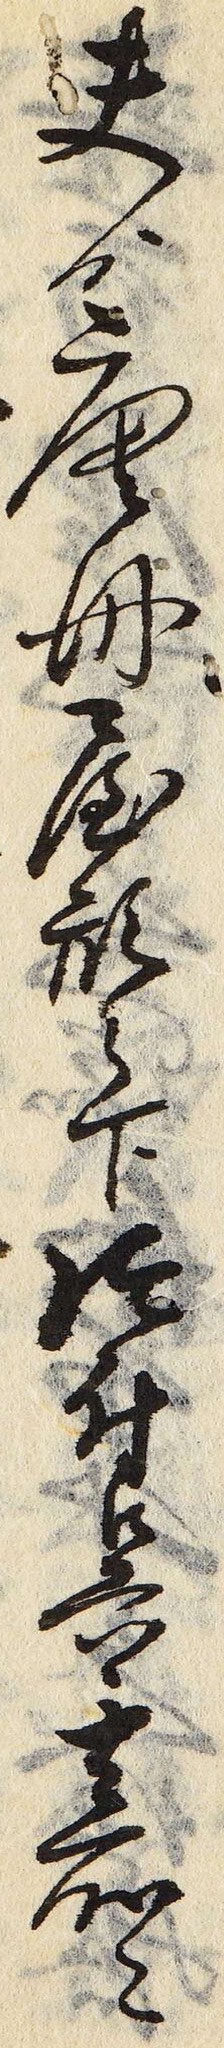夫ゟ唐舟屋形之下片付呉候其所へ
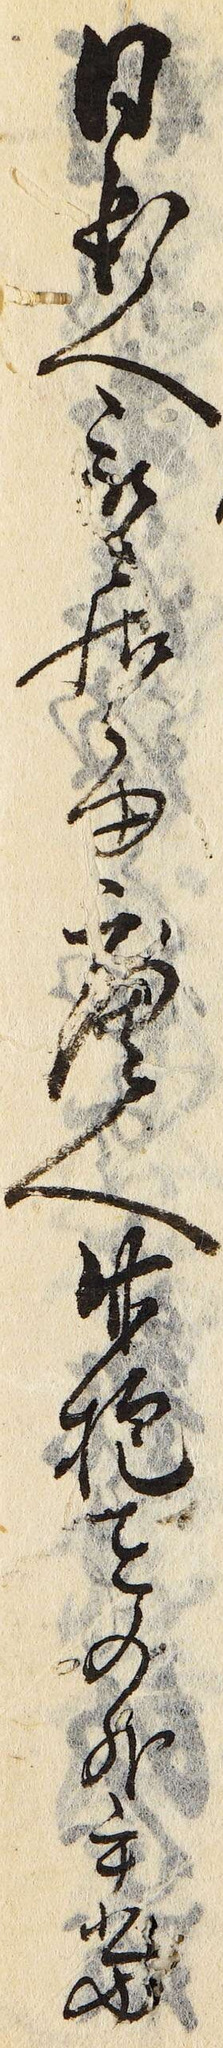日本人被居留唐人介抱ことの外手当
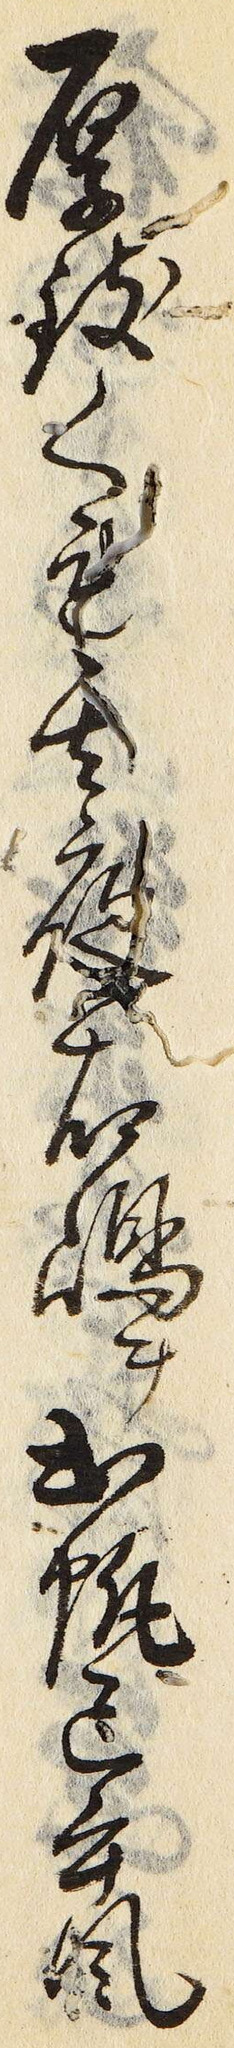厚致くれ其夜右嶋ヲ出帆已手風
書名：阿波幸宝丸漂流記
